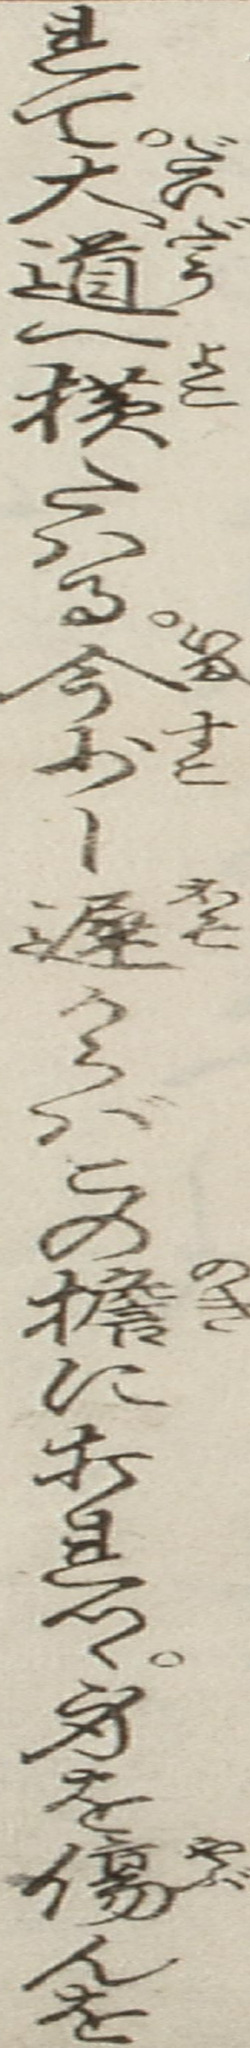れて。大道へ横たはる。今少し遅からばこの檐に打れつゝ。身を傷んを
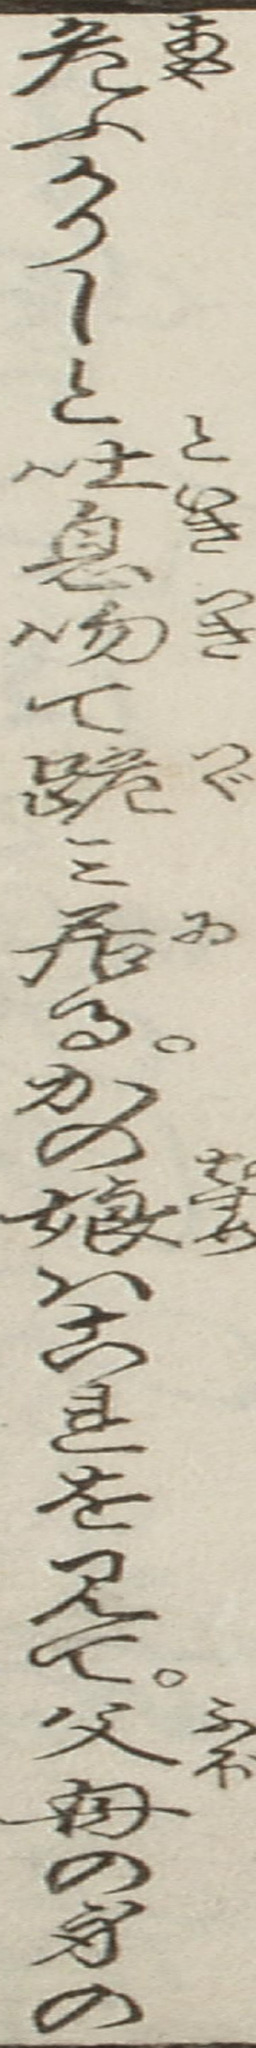危ふかりしと吐息吻て跪み居る。かの娘はこれを見て。父母の身の
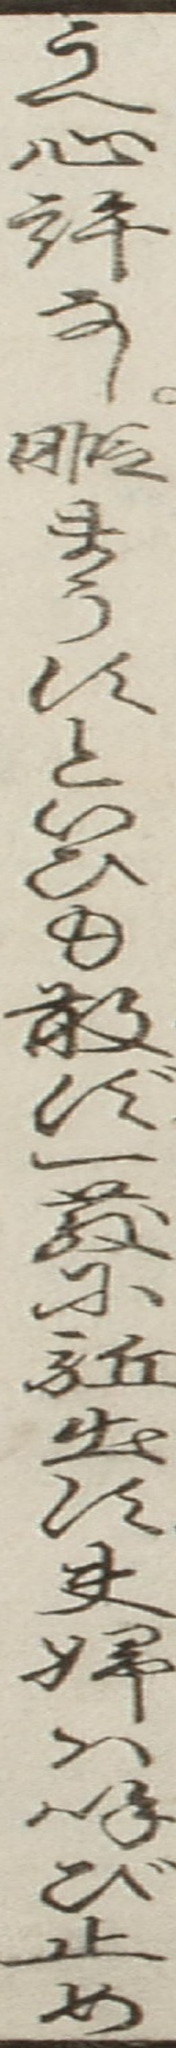うへ心許なし。暇まうすといひも敢ず。一散に駈出す。夫婦は呼び止め
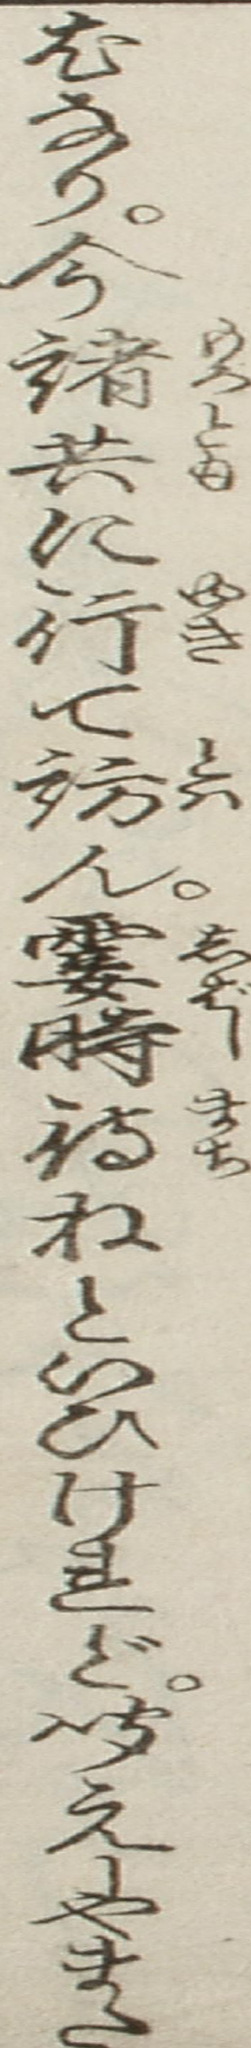尤なり。今諸共に行て訪ん。霎時待ねといひけれど。聞えしやまた
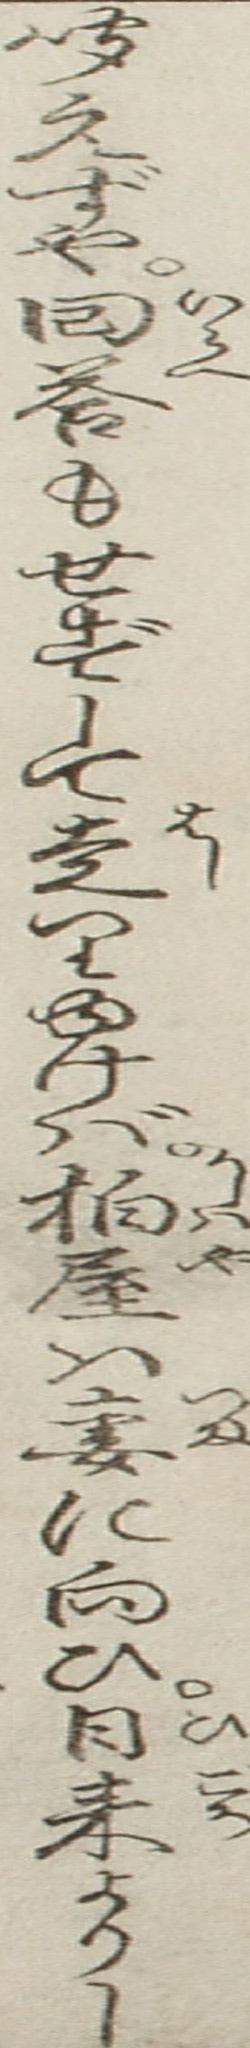聞えずや。回答もせずして走りゆけば。柏屋は妻に向ひ。日来よりし
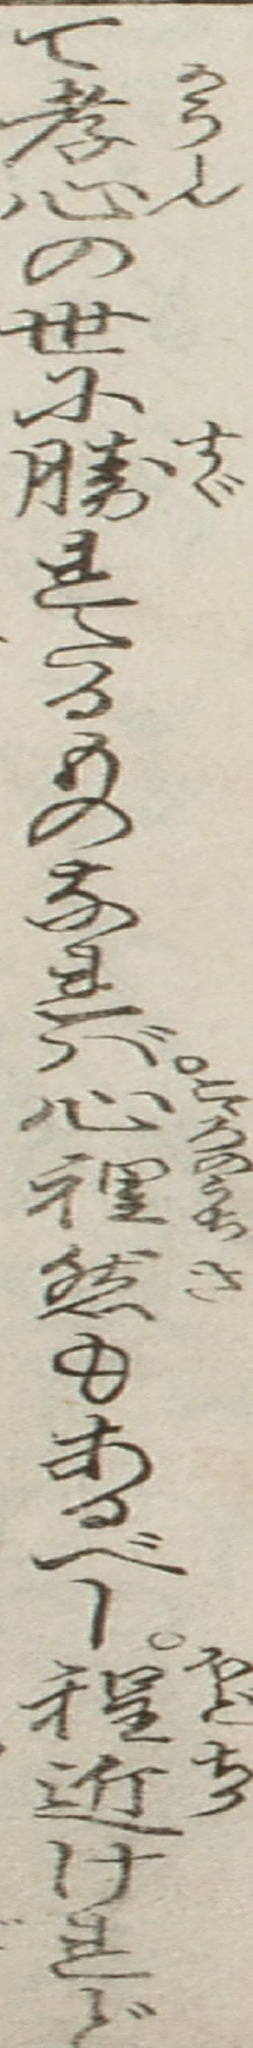て孝心の世に勝れたるものなれば。心裡然もあるべし。程近けれど
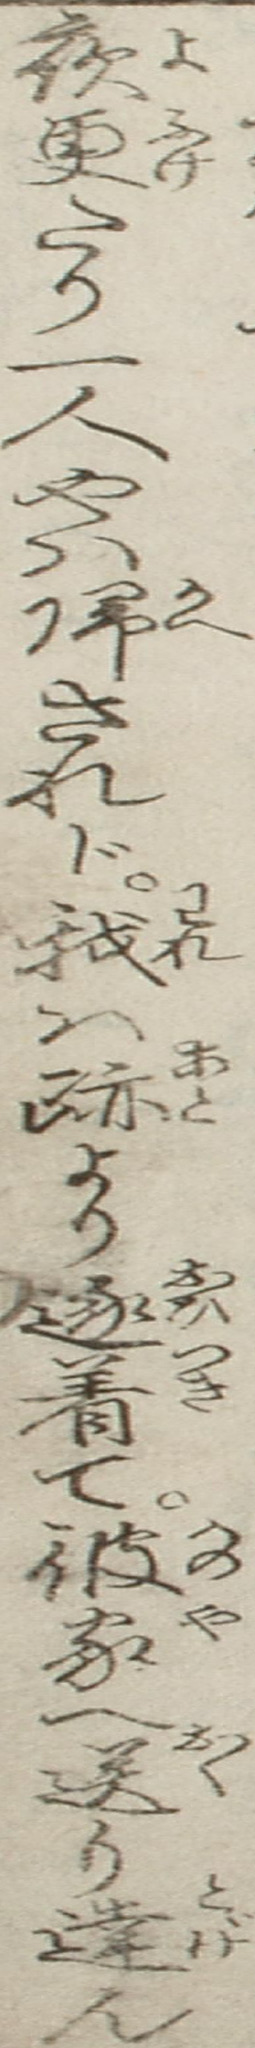夜更けたり一人やは帰されじ。我は跡より逐着て。彼家へ送り達ん

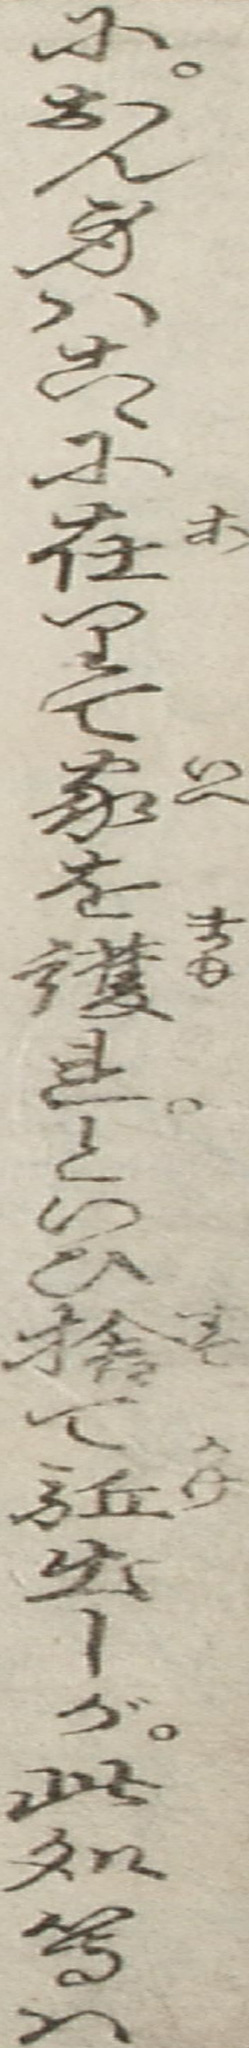に。おん身はこゝに在りて家を護れ。といひ捨て駈出しが。此所等は
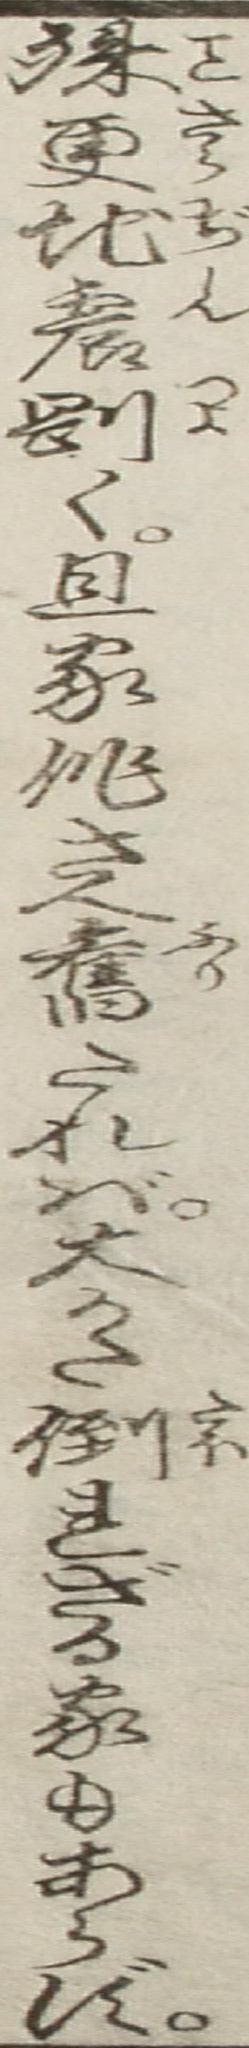殊更地震剛く。且家作さへ舊たれば。大かた倒れざる家もあらず。
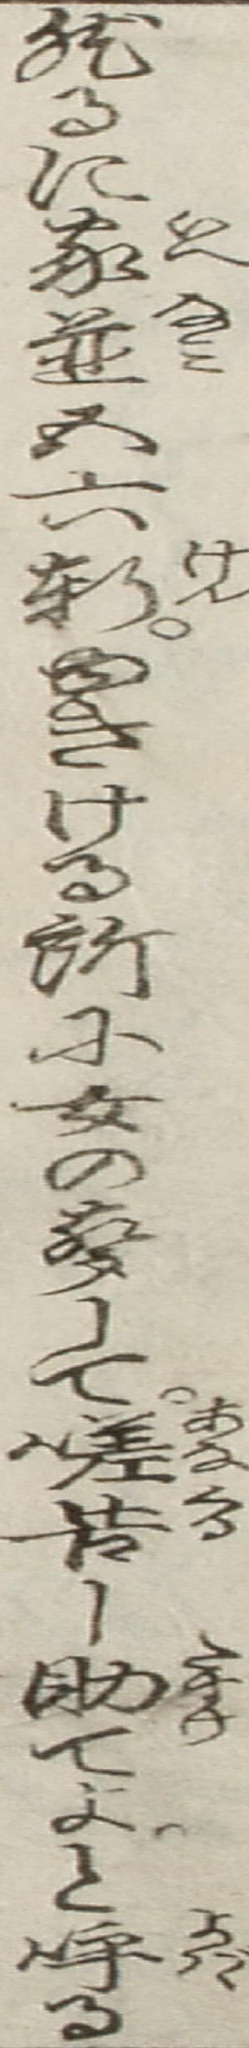然るに家並五六軒。ゆきける所に女の声して。嗟苦し助てよ。と呼る
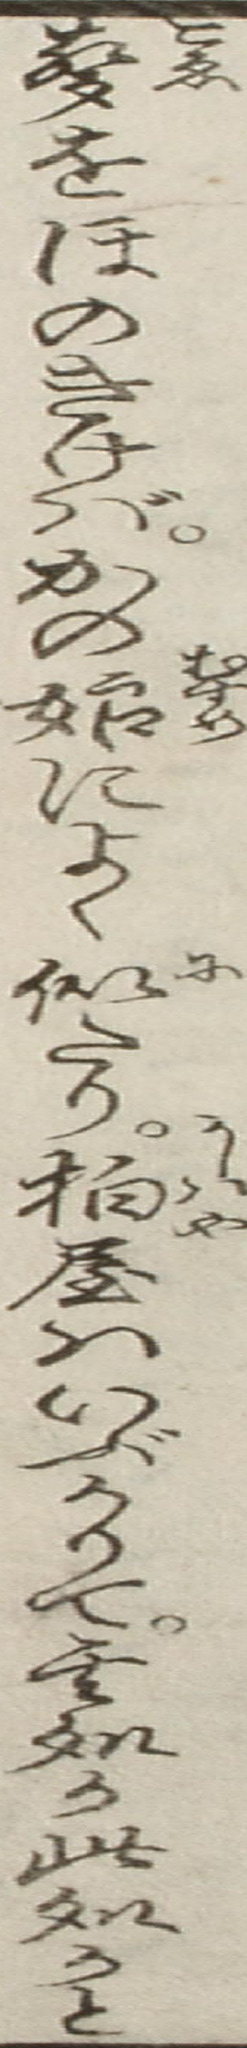声をほのきけば。かの娘によく似たり。柏屋はいぶかりて。其処か此処かと
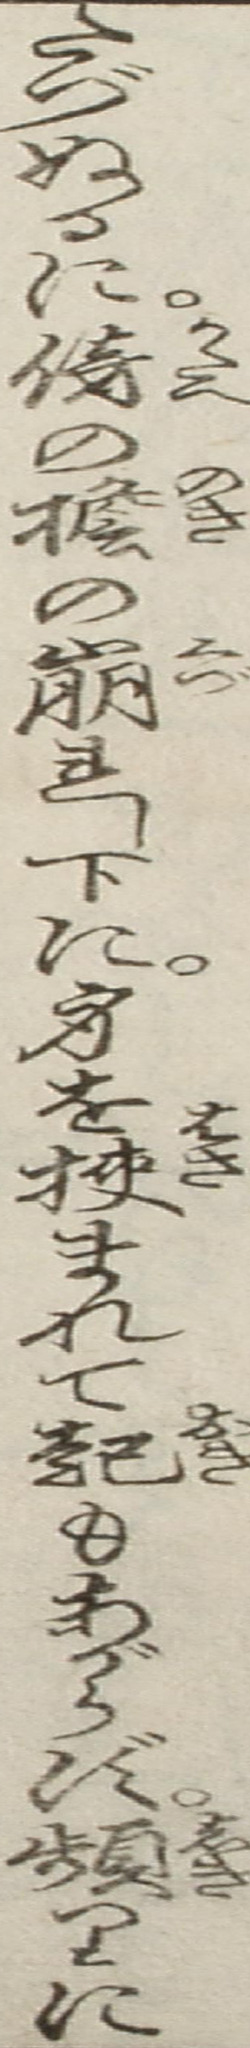たづぬるに。傍の檐の崩れし下に。身を挟まれて起もあがらず。頻りに
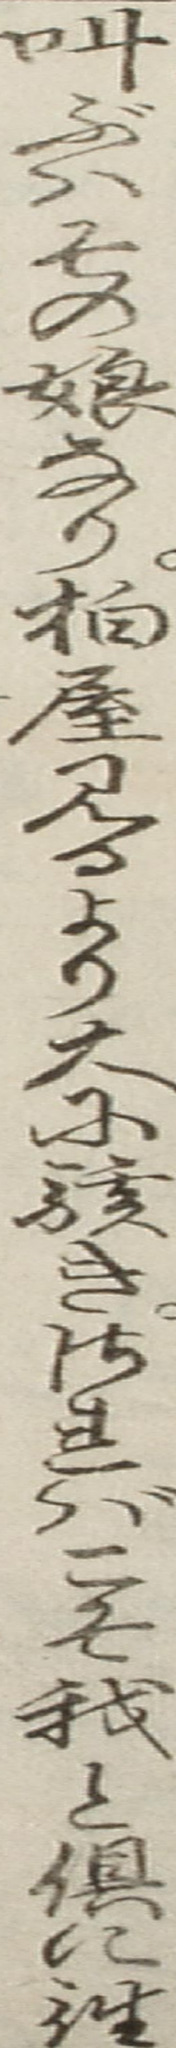叫ぶはその娘なり。柏屋見るより大に駭き。さればこそ我と俱に。往
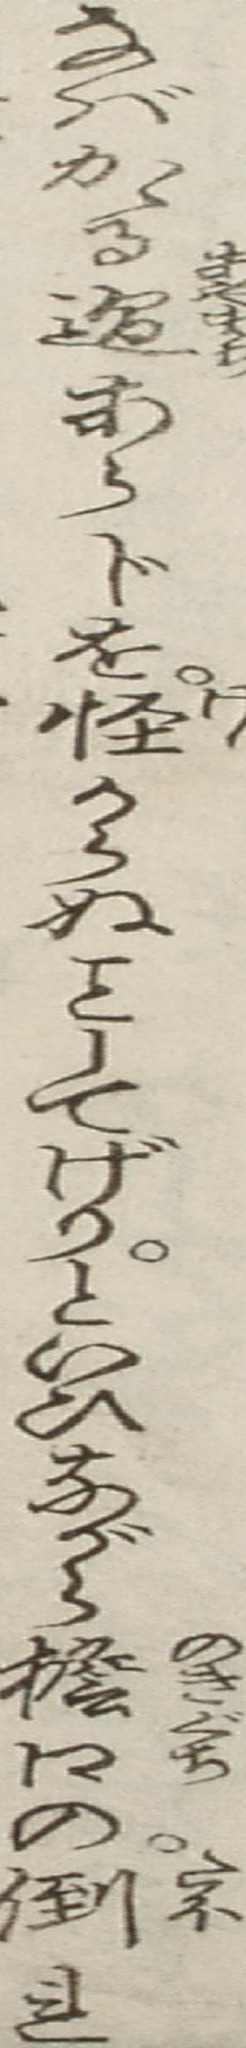なばかゝる過あらじを。怪からぬことしてげり。といひながら檐口の。倒れ
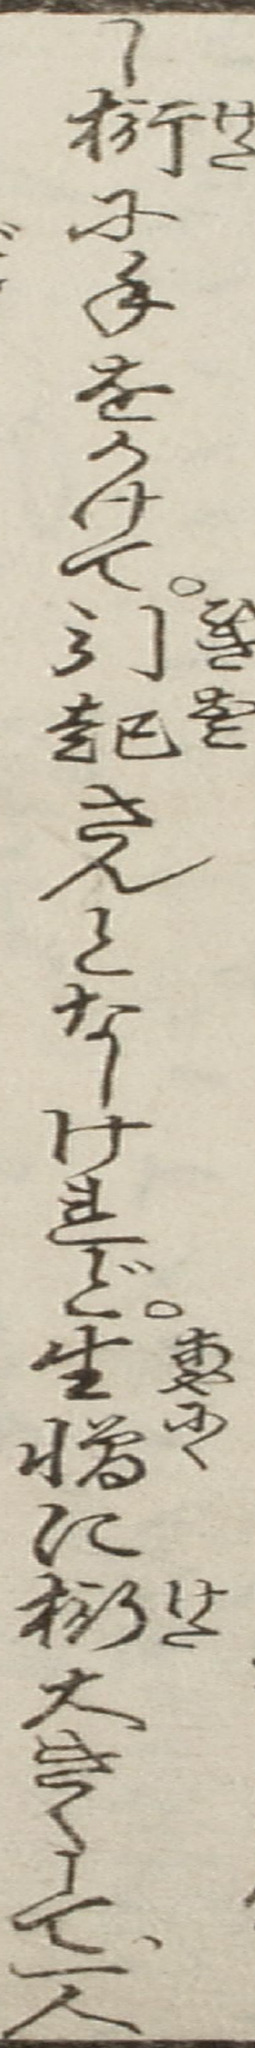し桁に手をかけて。引起さんとなしけれど。生憎に桁大きくして。一人
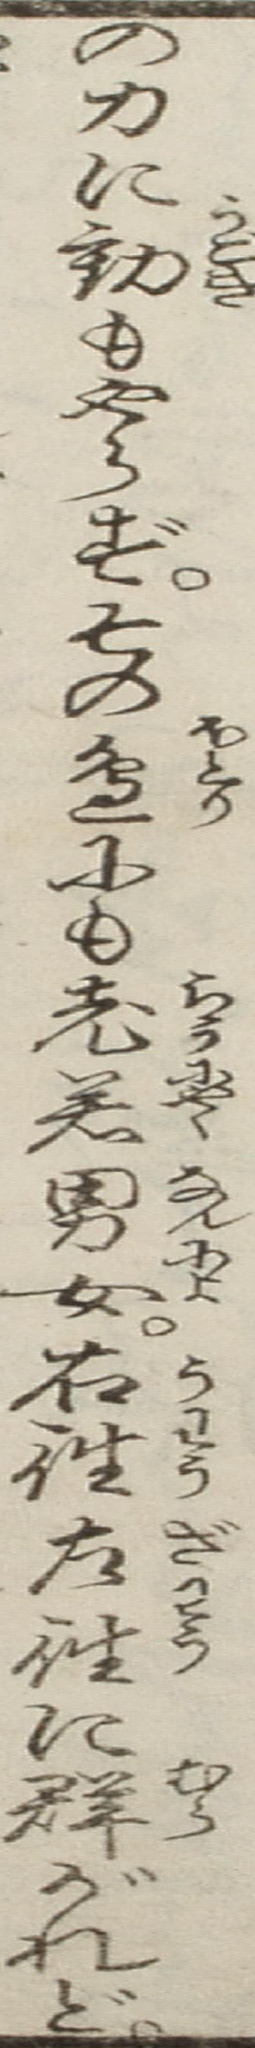の力に動もやらず。その辺にも老若男女。右往左往に群がれど。
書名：安政見聞録　上
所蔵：東京大学地震研究所図書室 Earthquake Research Institute Library, The University of Tokyo, JAPAN
